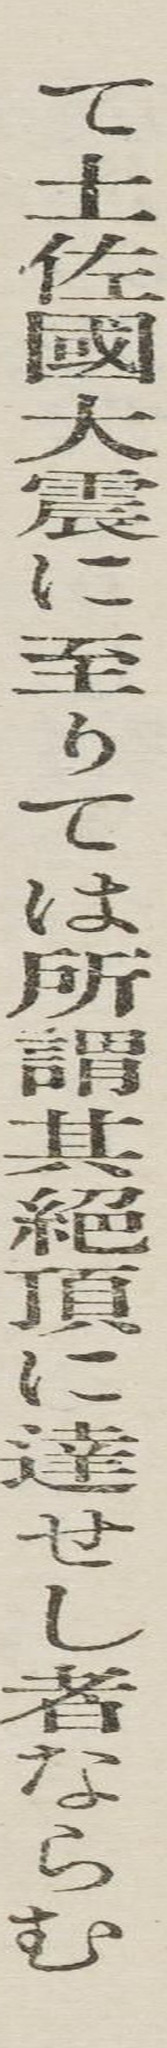て土佐国大震に至りては所謂其絶頂に達すせし者ならむ
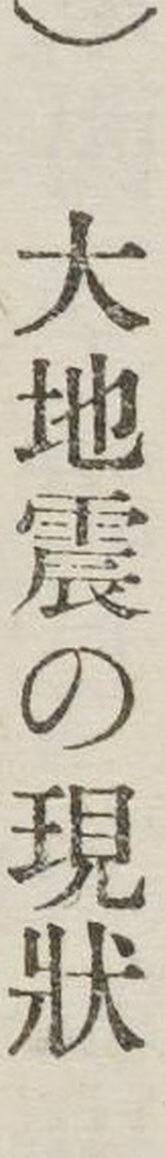大地震の現状
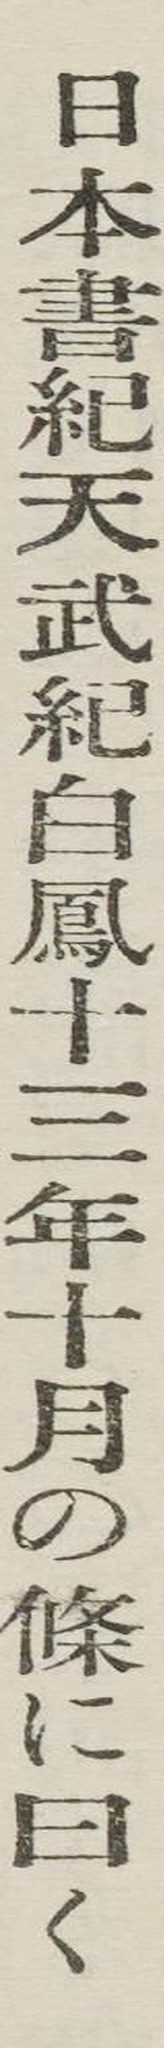日本書紀天武紀白鳳十三年十月の条に曰く
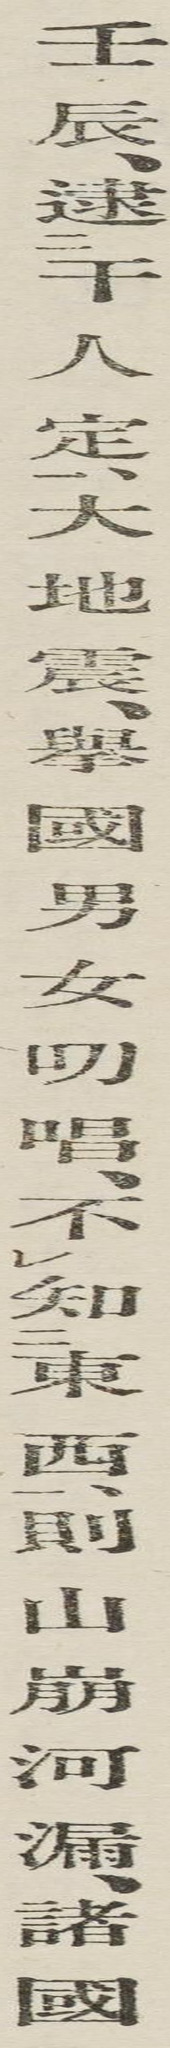壬辰、逮于人定、大地震、挙国男女叨唱、不知東西、則山崩河漏、諸国
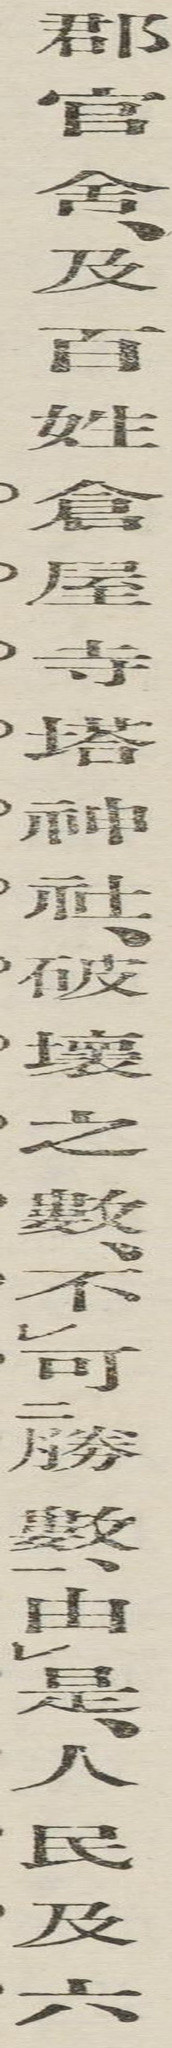郡官舎、及百姓倉屋寺塔神社、破壊之数、不可勝数、由是、人民及六
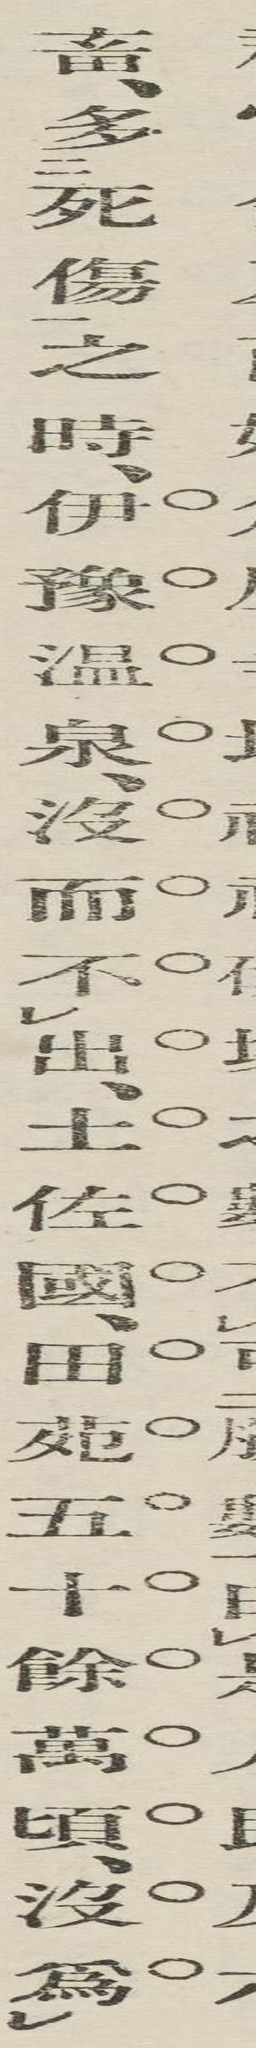畜、多死傷之時、伊予温泉、没而不出、土佐国、田苑五十余万頃、没為

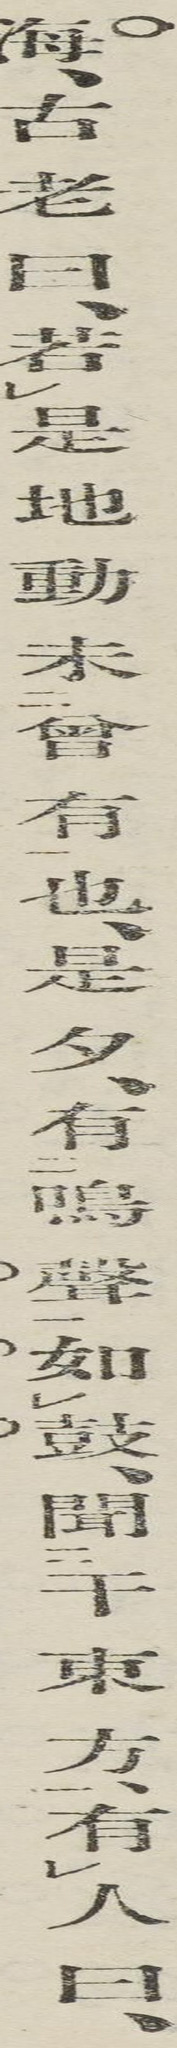海、古老曰、若是地動未曾有也、是夕、有鳴声如鼓、聞于東方、有人曰、
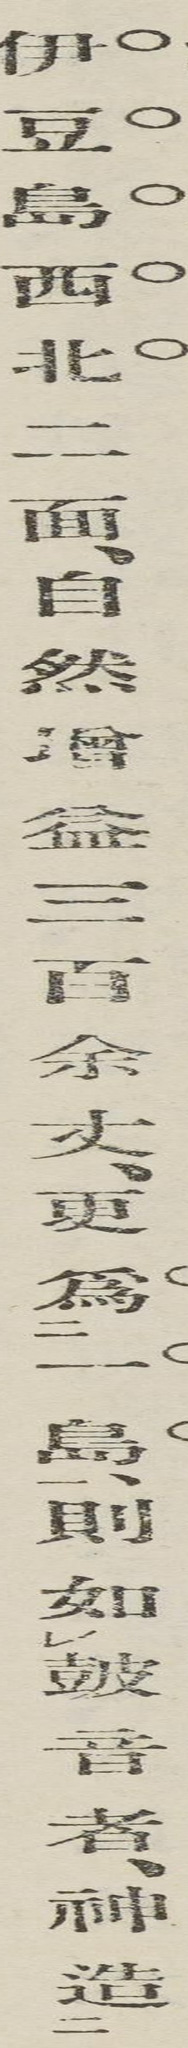伊豆島西北二面、自然増益三百余丈、更為一島、則如鼓音者、神造
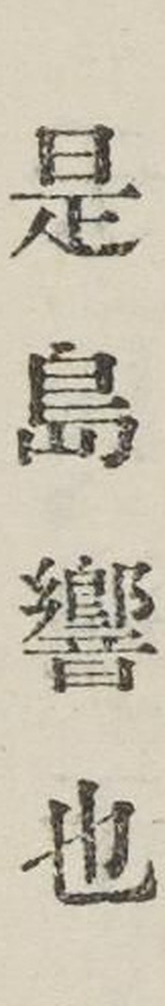是島響也
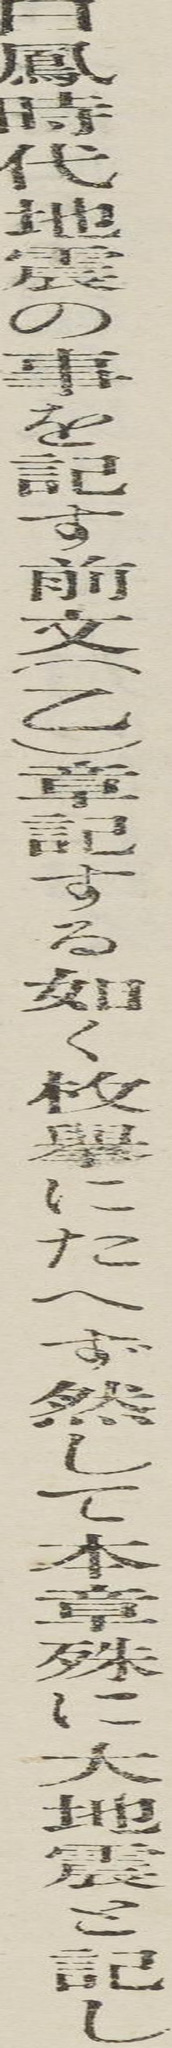白鳳時代地震の事を記す前文章記する如く枚挙にたへず然して本章殊に大地震と記し
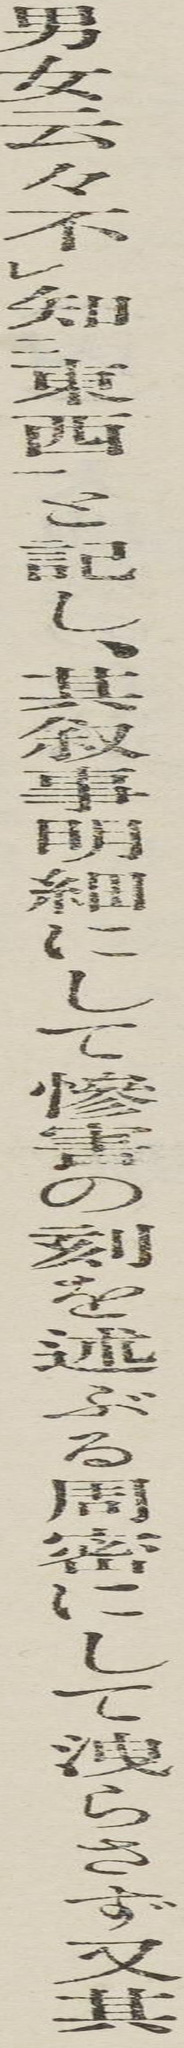男女云々不知東西と記し、其叙事明細にして惨害の刻を述ぶる周密にして洩らさず又其
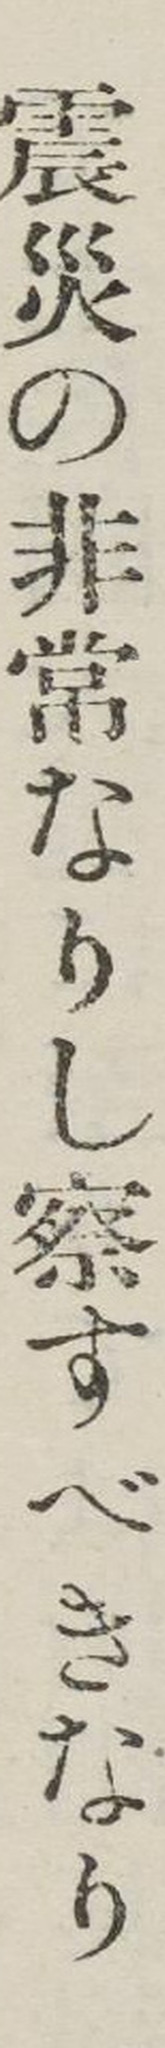震災の非常なりし察すべきなり
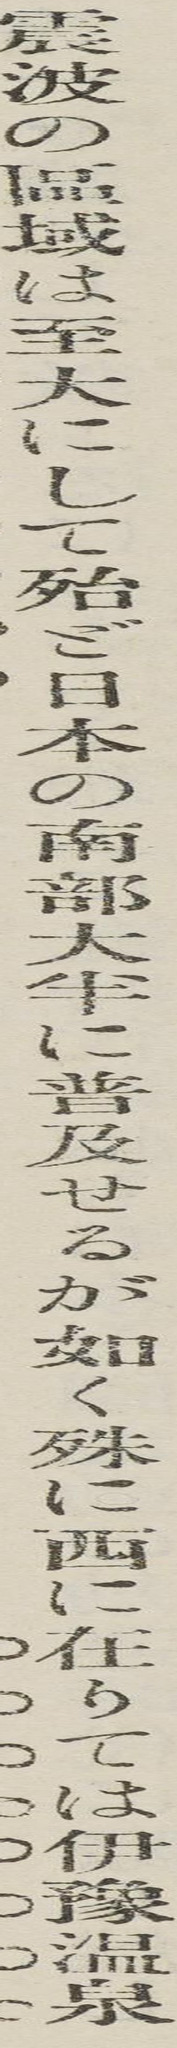震波の区域は至大にして殆ど日本の南部大半に普及せるが如く殊に西に在りては伊予温泉
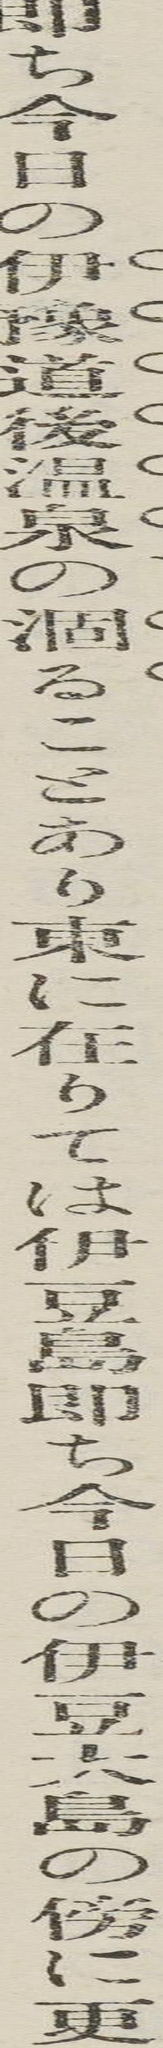即ち今日の伊予道後温泉の涸ることあり東に在りては伊豆大島即ち今日の伊豆大島の傍に更
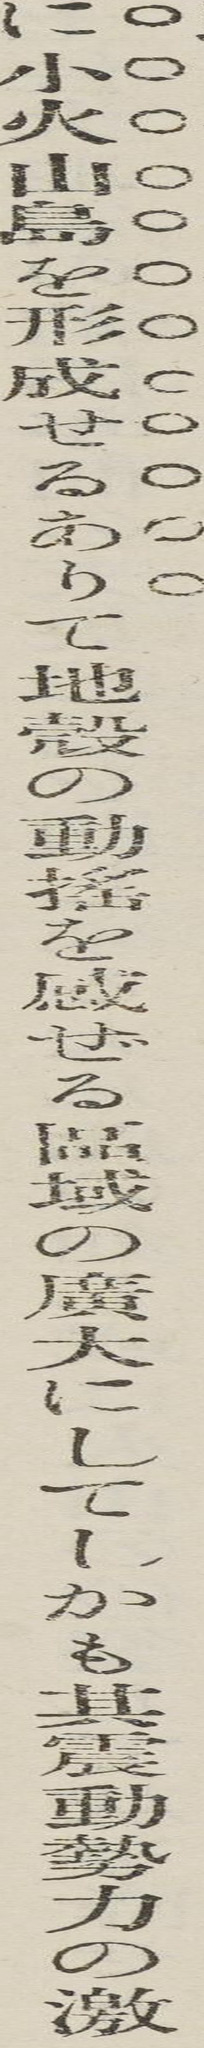に小火山島を形成せるありて地殻の動揺を感ぜる区域の広大にしてしかも其震動勢力の激
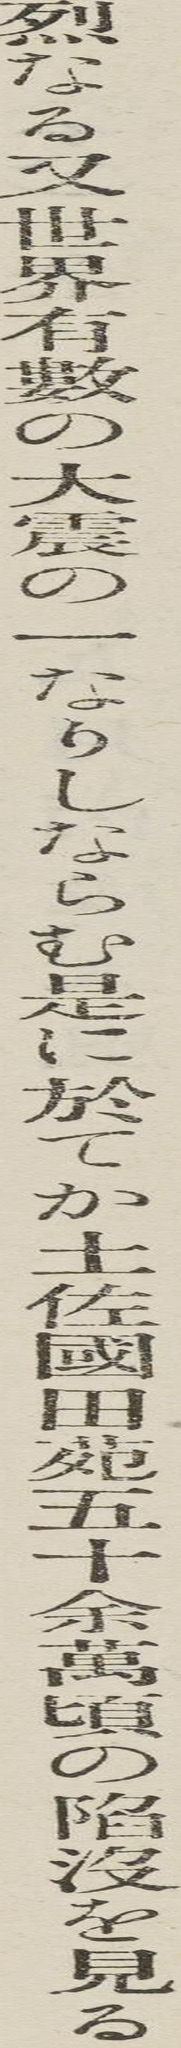烈なる又世界有数の大震の一なりしならむ是に於てか土佐国田苑五十余万頃の陥没を見る
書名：土佐古今ノ地震
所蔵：東京大学地震研究所図書室 Earthquake Research Institute Library, The University of Tokyo, JAPAN
